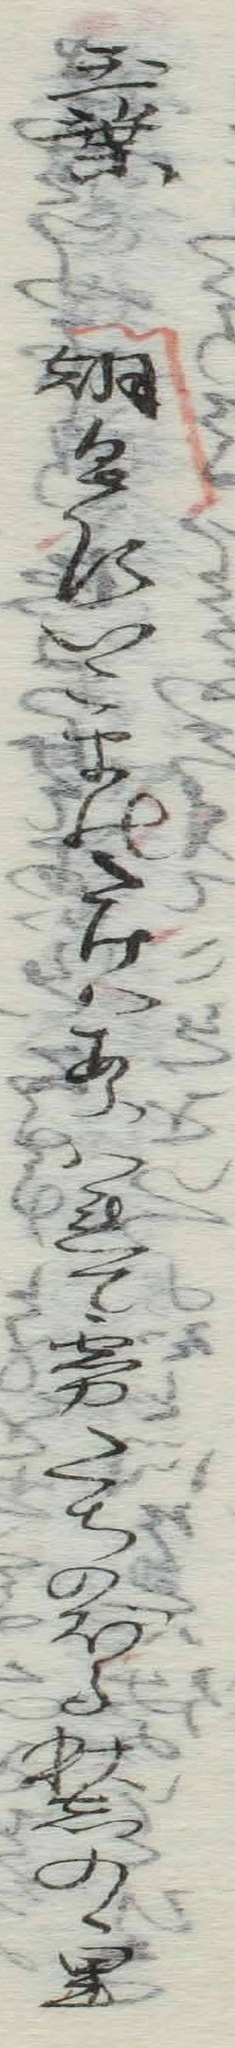玉葉〽朝日さすいこまのたけはあらはれて霧たちのぼる秋しのゝ里
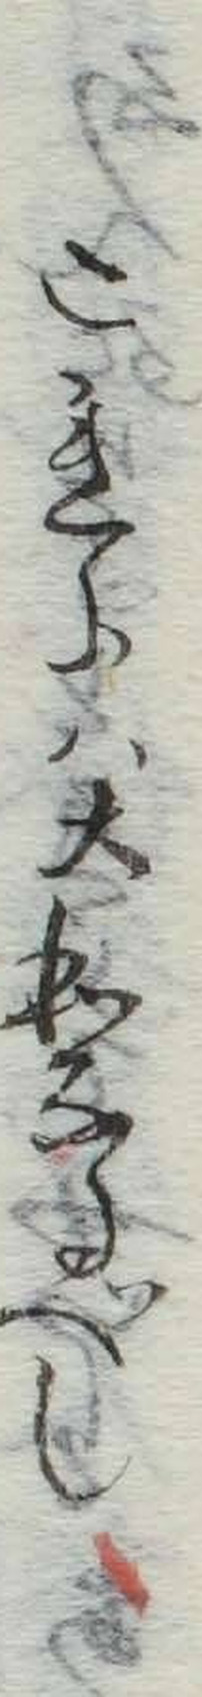これらは大和なるべし、

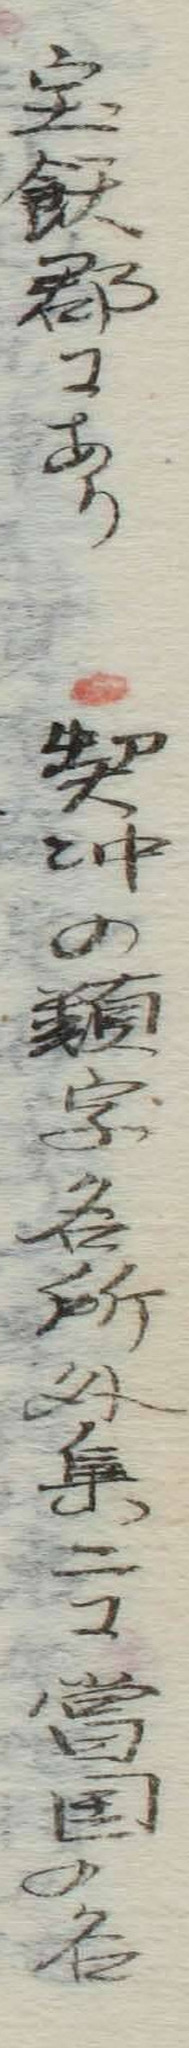○篠束宝飫郡にあり●契沖の類字名所外集二に当国の名
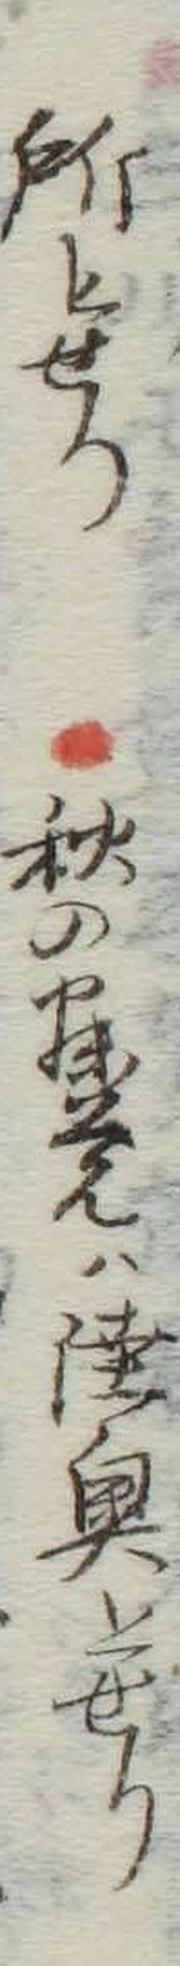所とせり●秋の寝覚は陸奥とせり
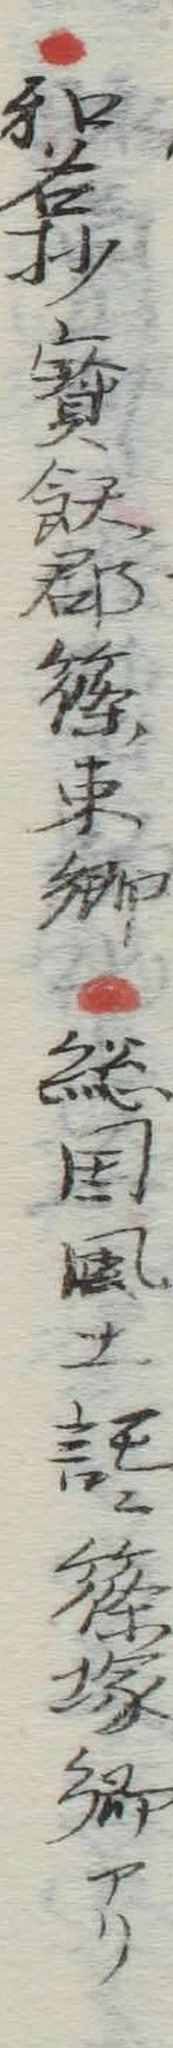●和名抄寶飫郡篠束郷●総国風土記ニ篠塚郷アリ
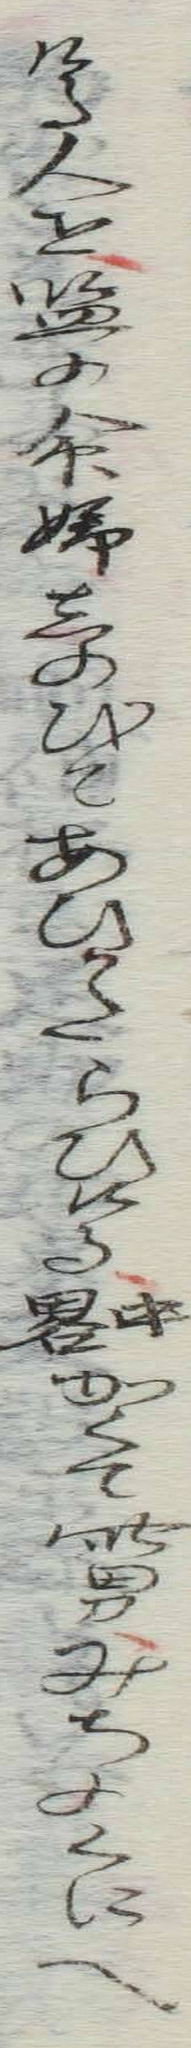ける人を、監の命婦しのびてあひかたらひける、中略かくて此男、みちのくにへ
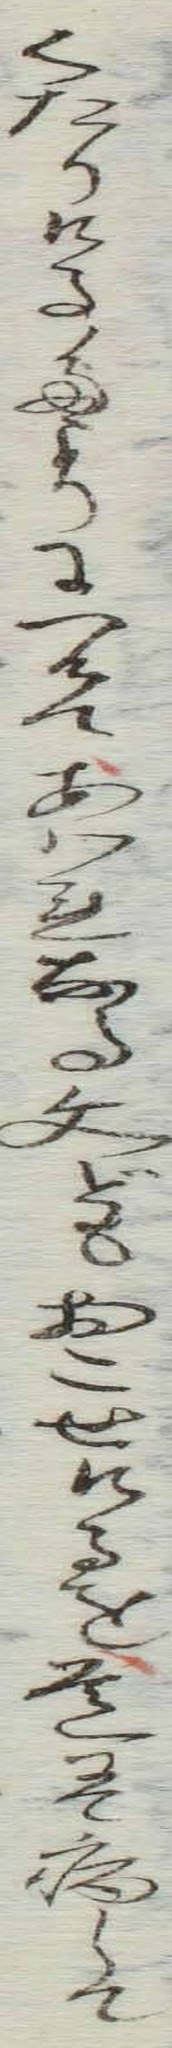くたりけるたよりにつけて、あはれなる文どもおこせけるを、道にて病して
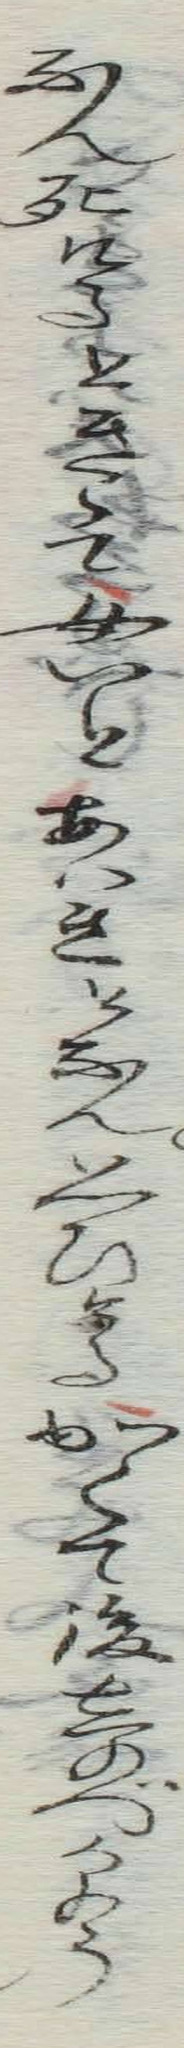なん死けるときゝて、女いとあはれとなん思ひける、かくて後しのづかのう
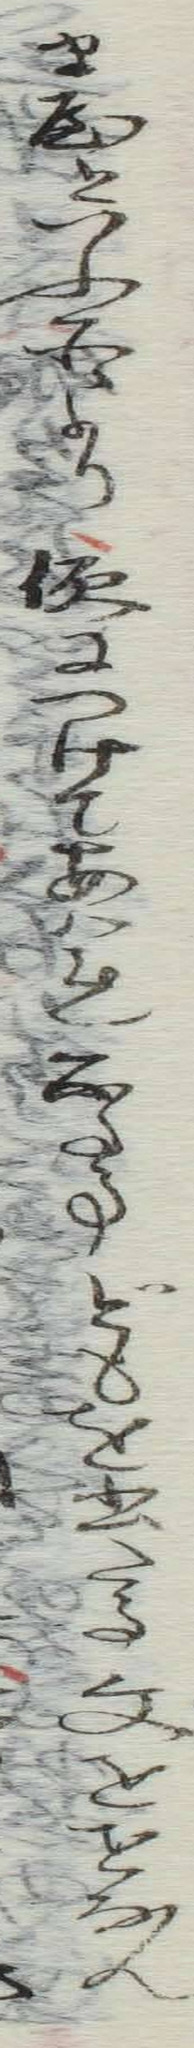まやといふ所より、便につけてあはれなる事どもを書たる文ををなん
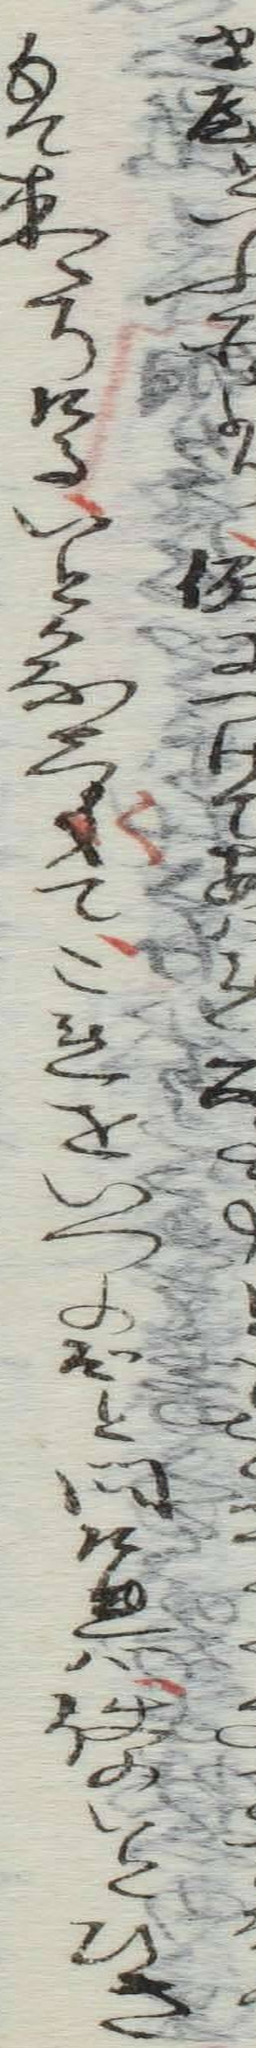もて来たりける、いとかなしくて、これをいつのぞと問ければ、使のいとひさ
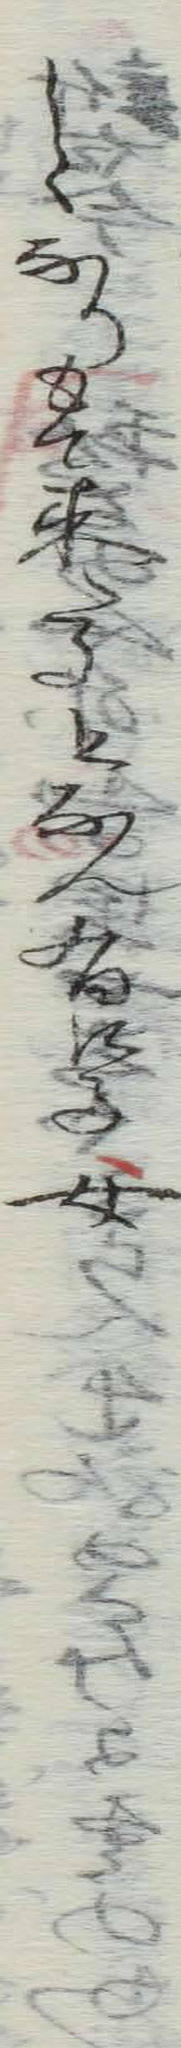しくなりもて来たるとなん有ける、女
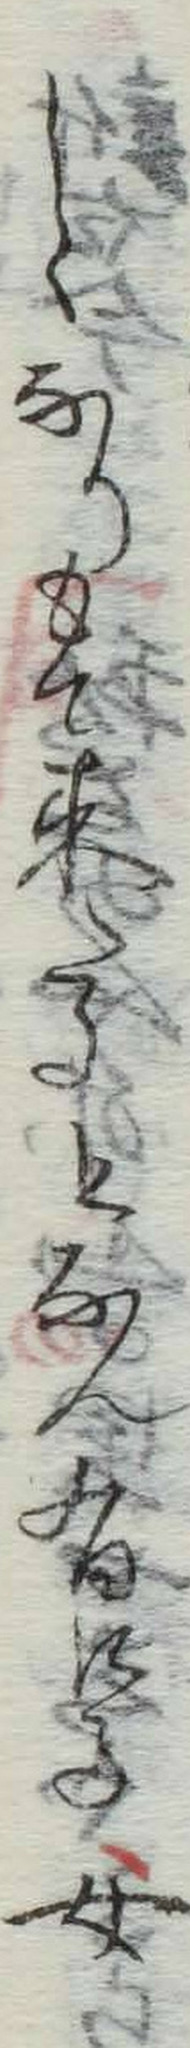しくなりもて来たるとなん有ける、女
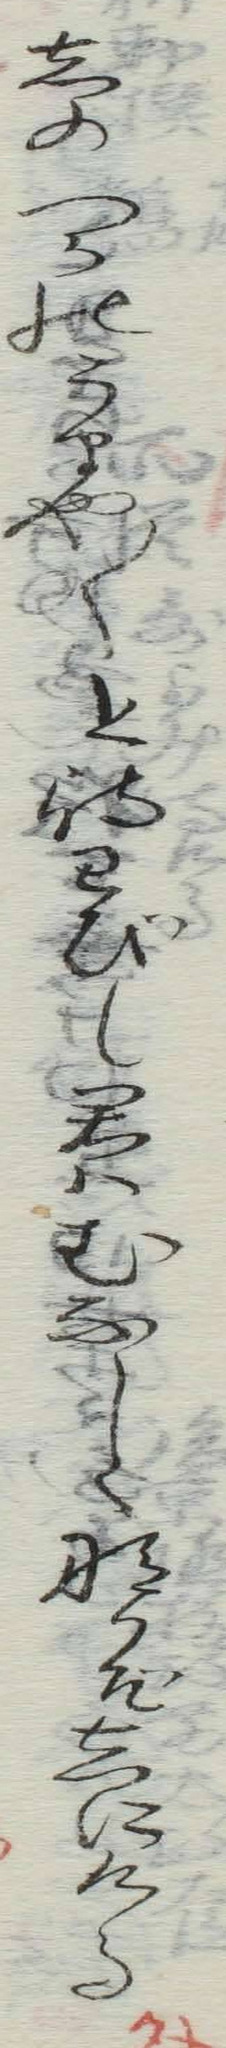しのつかのうまや〳〵と待わびし君はむなしくなりぞしにける外
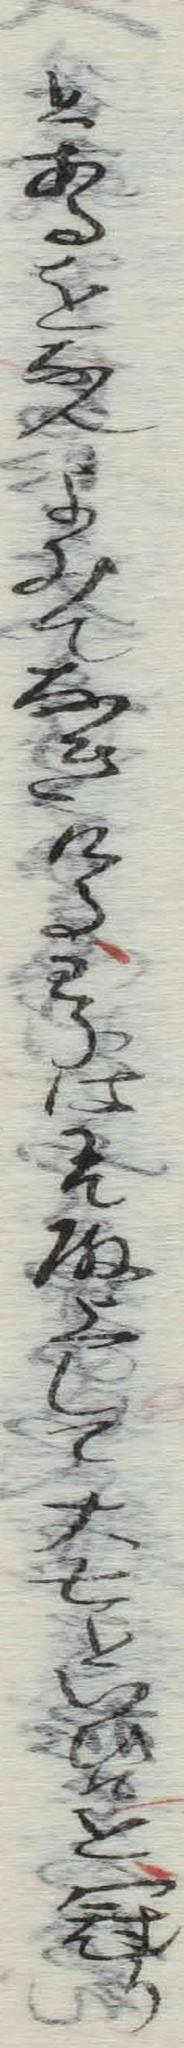とあるをなんよみてなきける、わらはにて殿上して大七といひけると、冠り
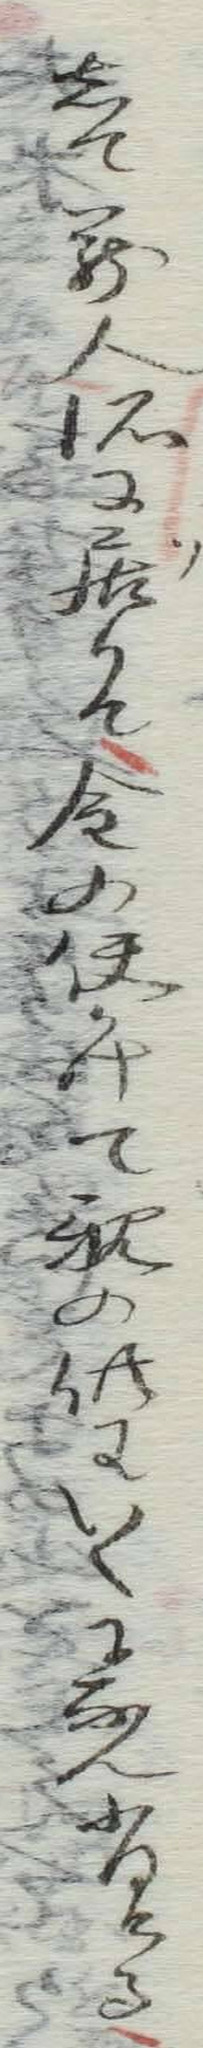して蔵人所に居りて、金の使かけて親の供にいくになん有ける、
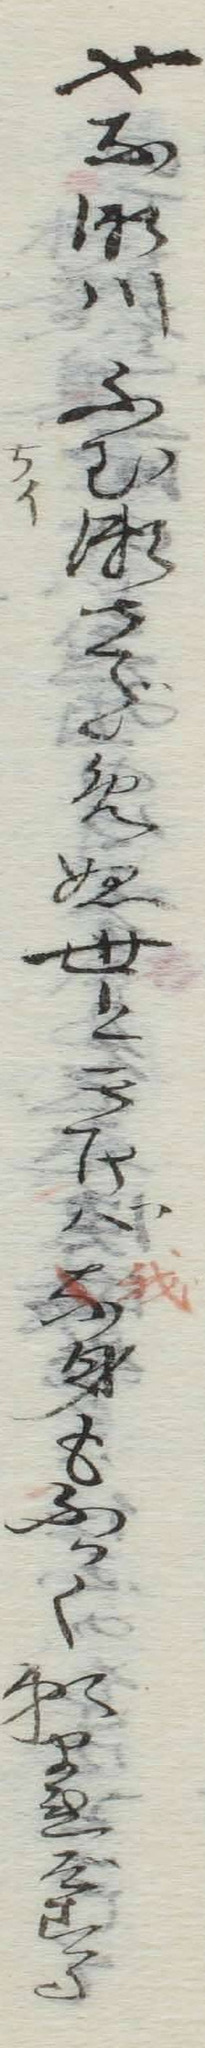やな瀬川ふむ瀬さだめぬ世ときけば我身もふかく頼まれぞする
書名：三河国古跡考
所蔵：国文学研究資料館
